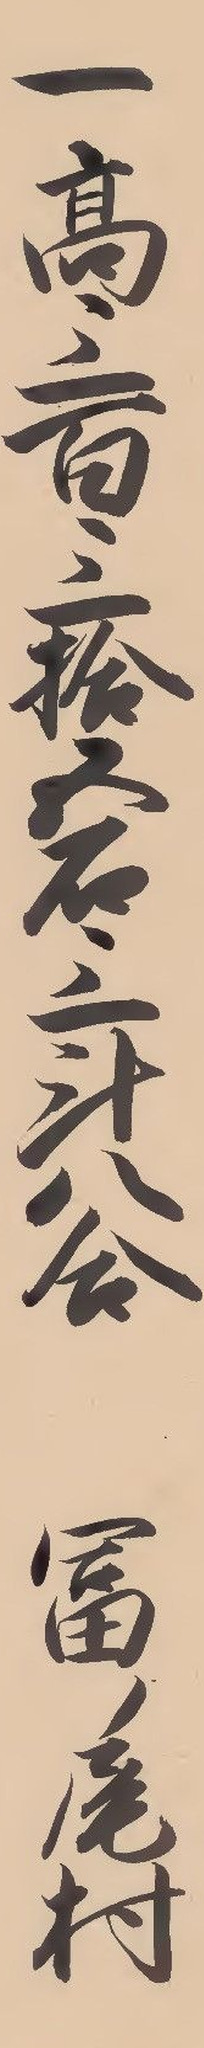一高三百三拾五石三斗八合富ノ尾村
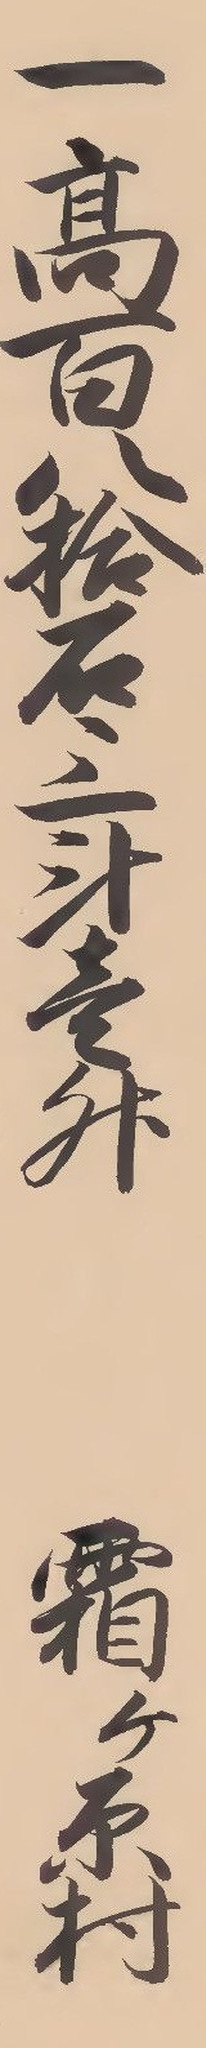一高百八拾石三斗壱升霜ヶ原村
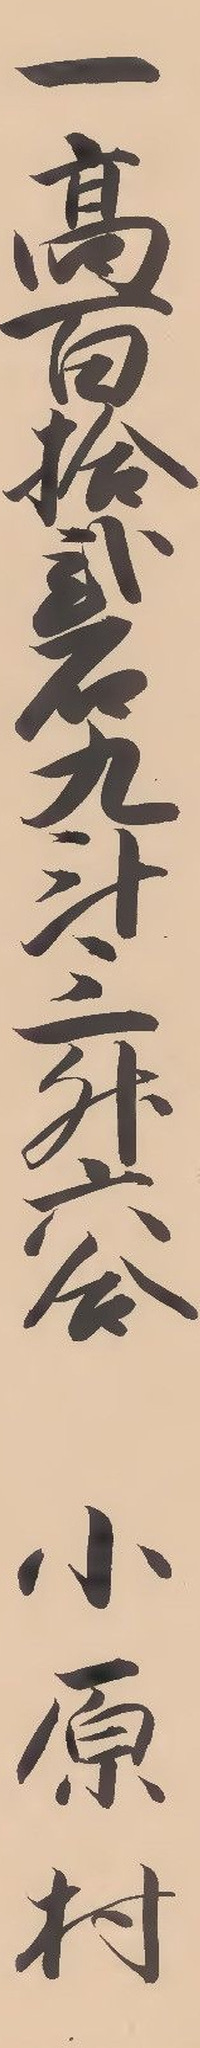一高百拾弐石九斗三升六合小原村
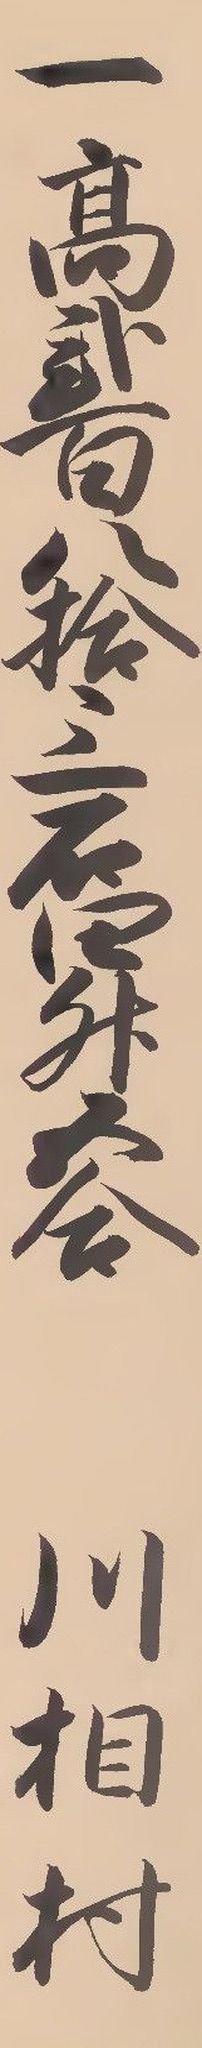一高弐百八拾三石四升五合川相村
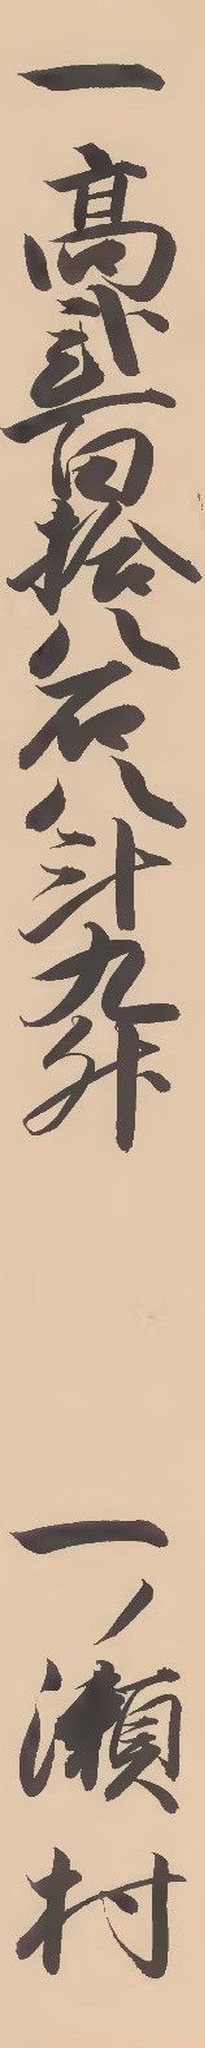一高弐百拾八石八斗九升一ノ瀬村
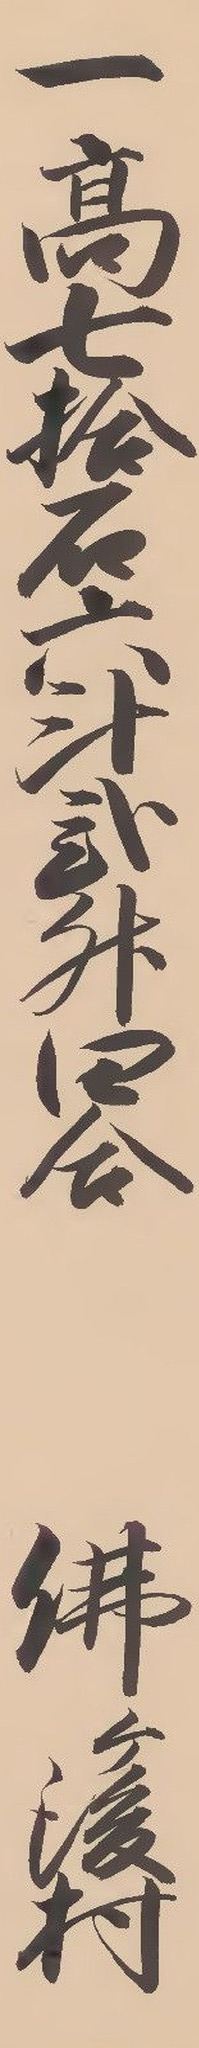一高七拾石六斗弐升四合仏ヶ後村
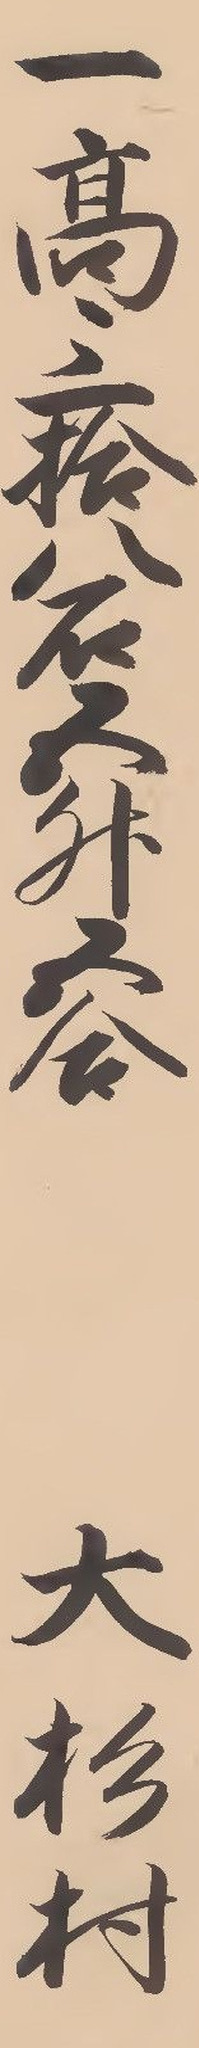一高三拾八石五升五合大杉村

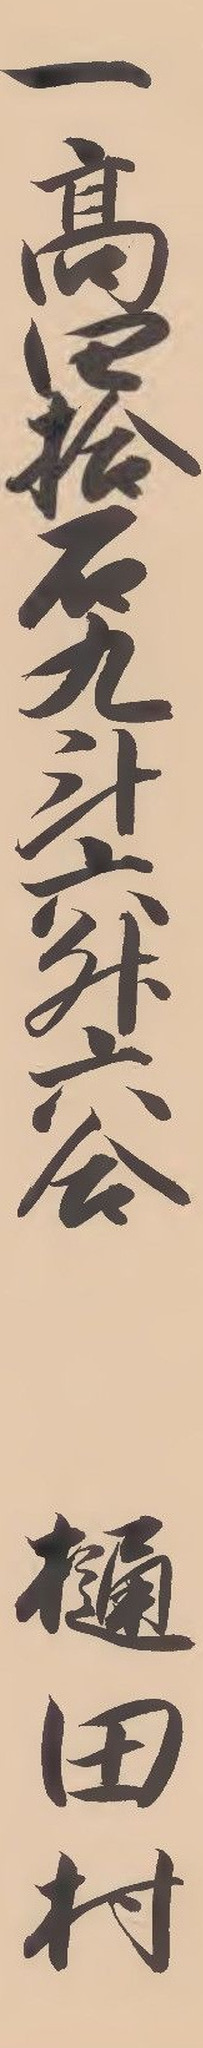一高四拾石九斗六升六合樋田村
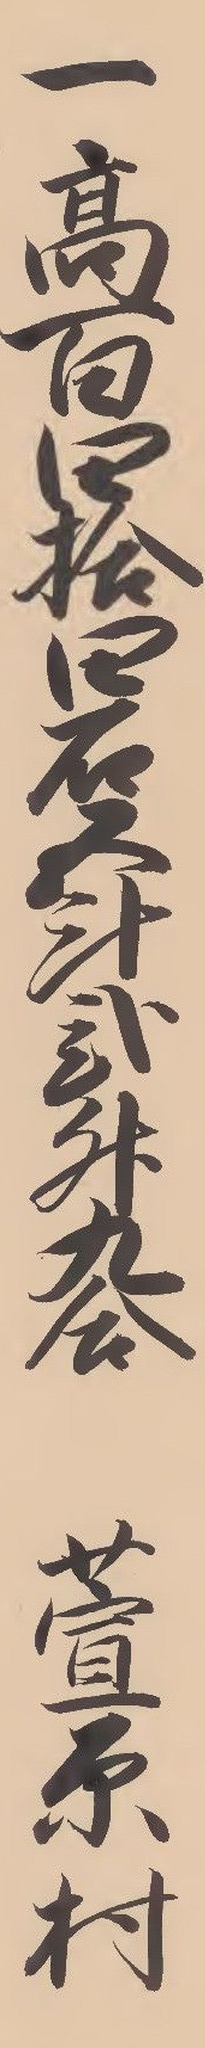一高百四拾四石五斗弐升九合萱原村
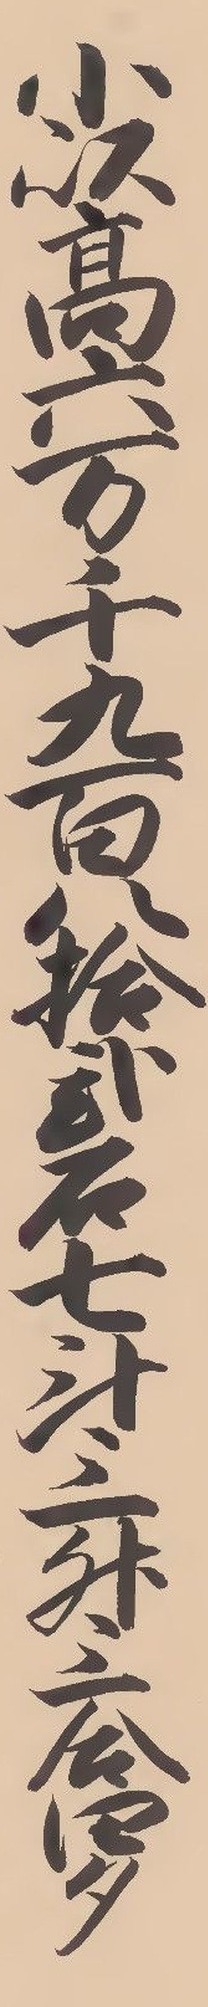小以高六万千九百八拾弐石七斗三升三合四勺
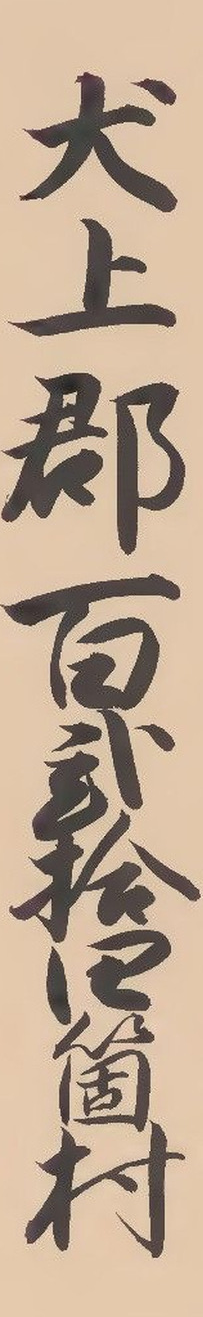犬上郡百弐拾四箇村
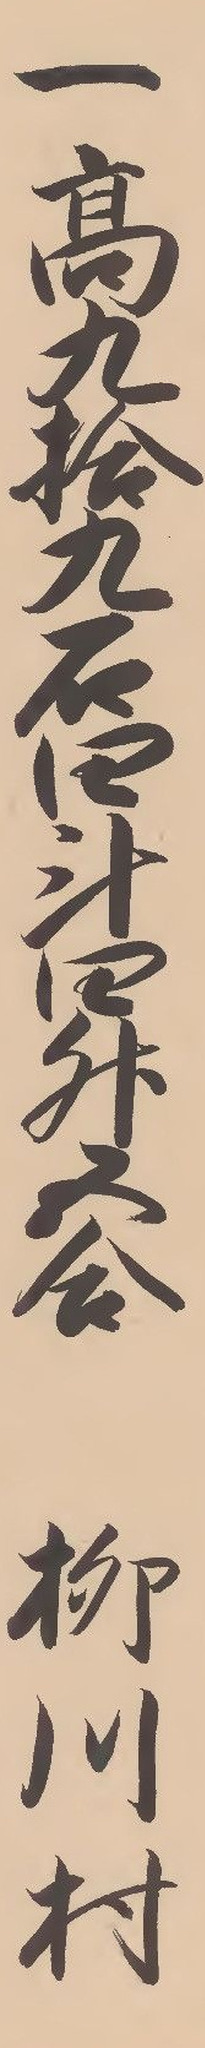一高九拾九石四斗四升五合柳川村
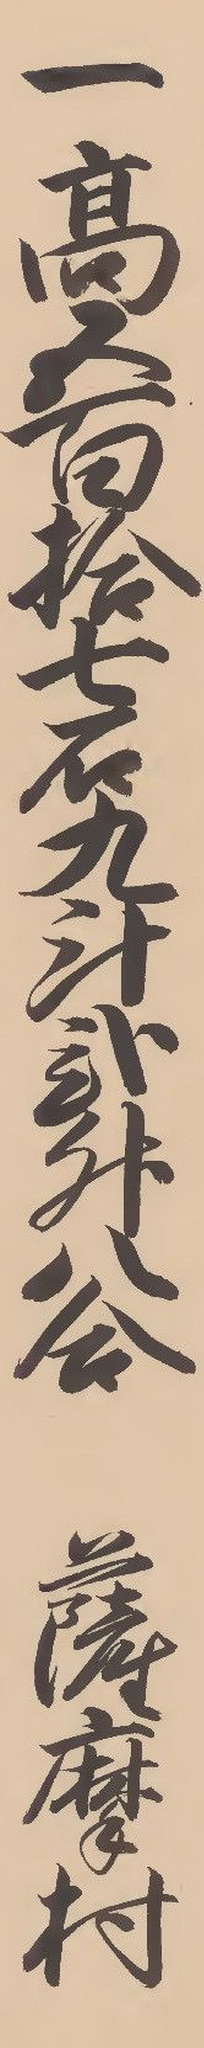一高五百拾七石九斗弐升八合薩摩村
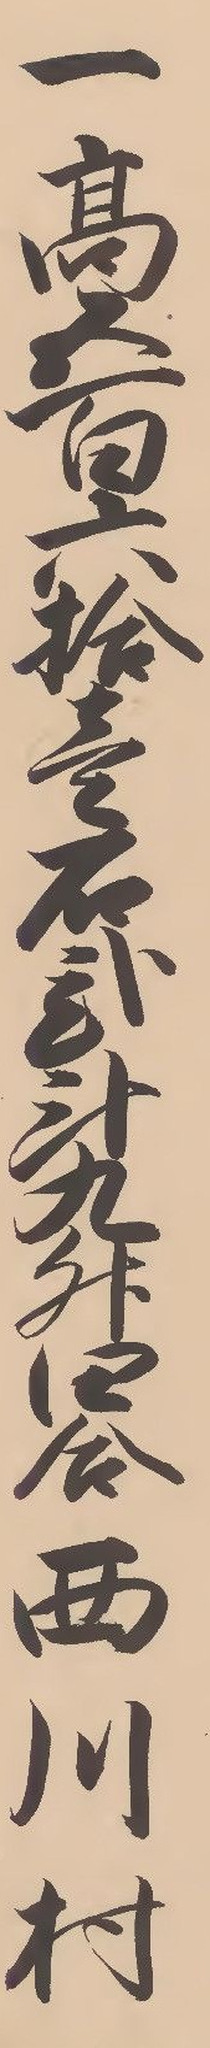一高五百六拾壱石弐斗九升四合西川村

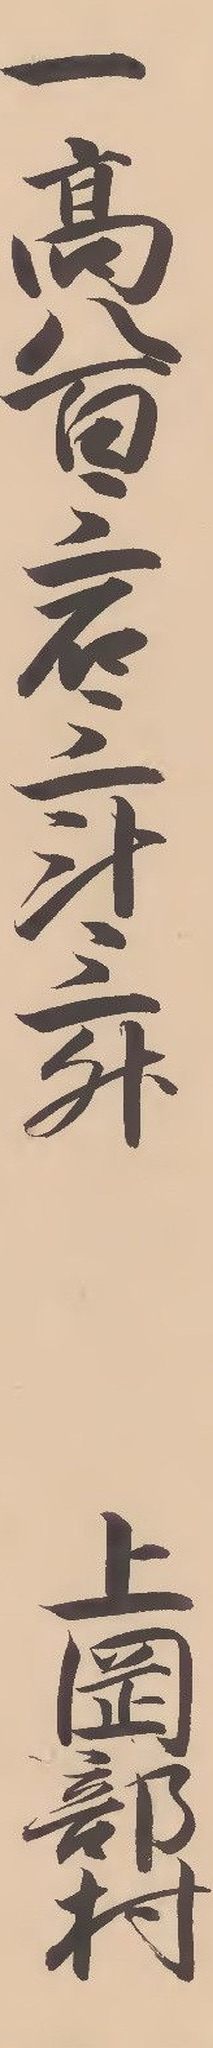一高八百三石三斗三升上岡部村
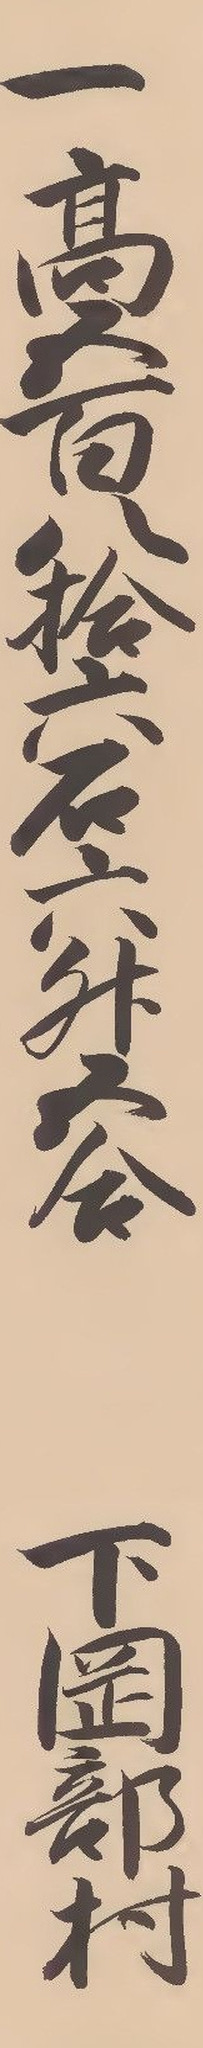一高五百八拾六石六升五合下岡部村
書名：近江国郷帳
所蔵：国立公文書館 National Archives of Japan
